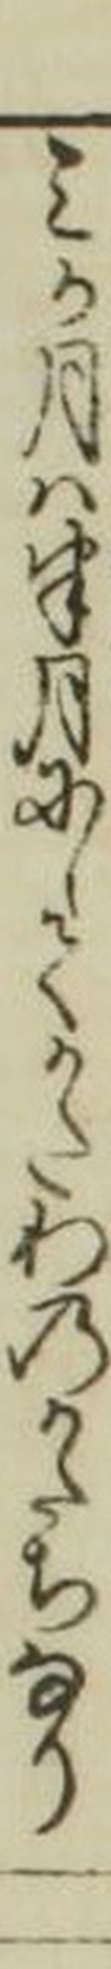みか月は半月にしてかたわのかたちなり
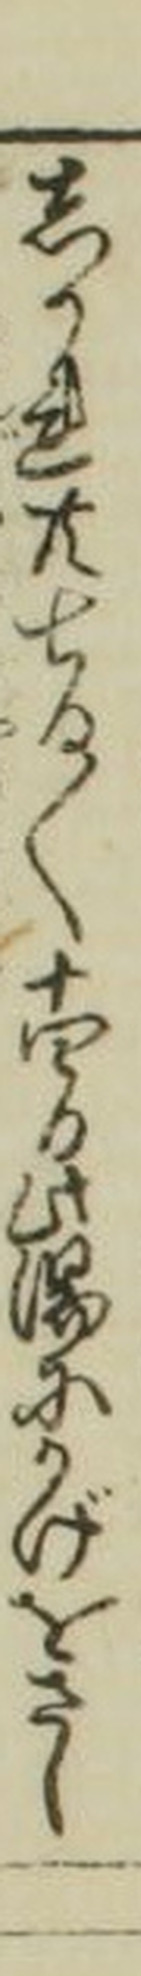しかれ共七日〳〵十四日此湯にかげをさし
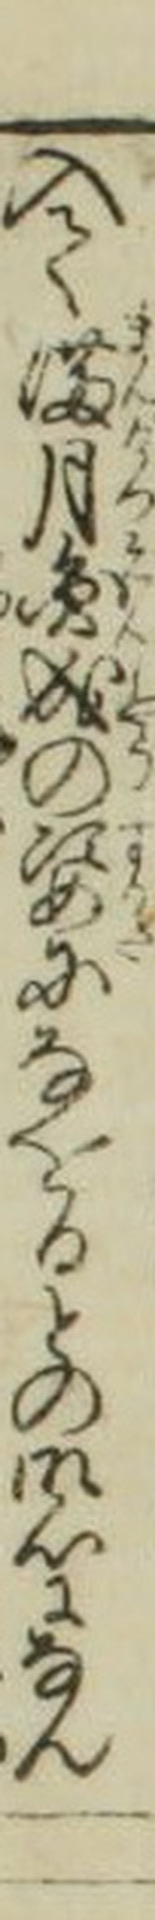入て満月円成の姿になをるとの御心になん
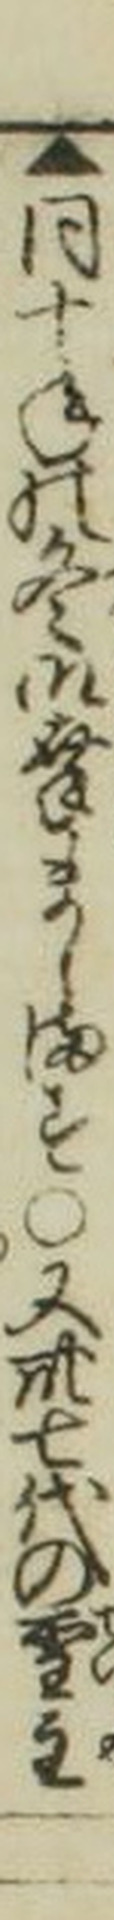▲同十年の冬御幸まします◯又卅七代の聖主
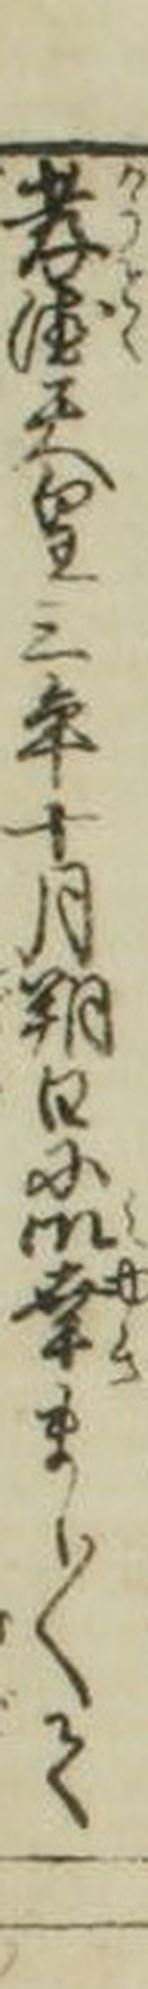孝徳天皇三年十月朔日に御幸まし〳〵て
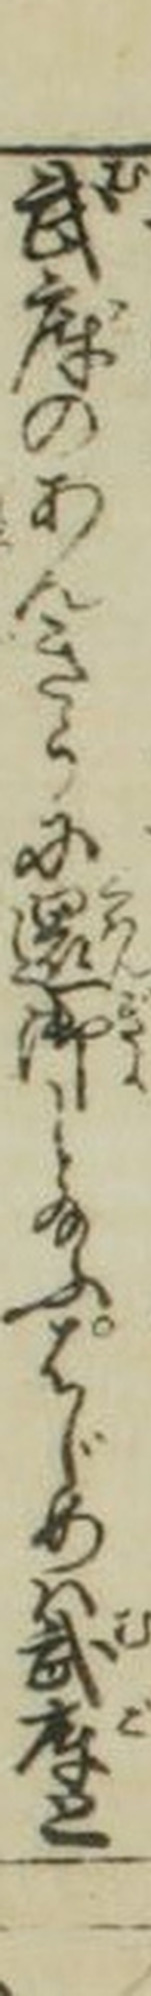武庫のあんきうに還御し給ふ。はじめは武庫と
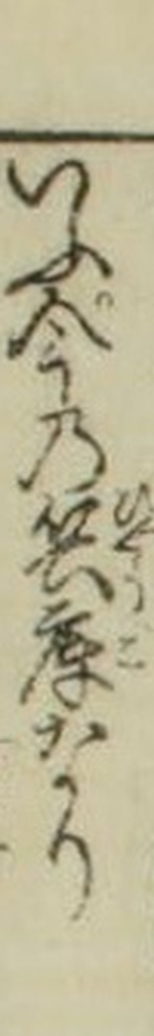いふ。今の兵庫なり
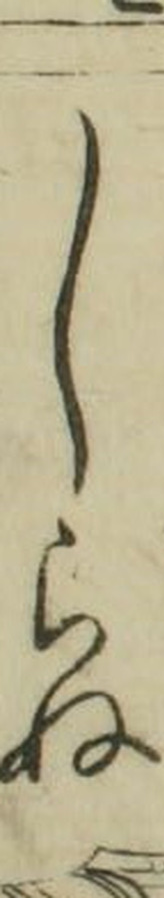しらぬ
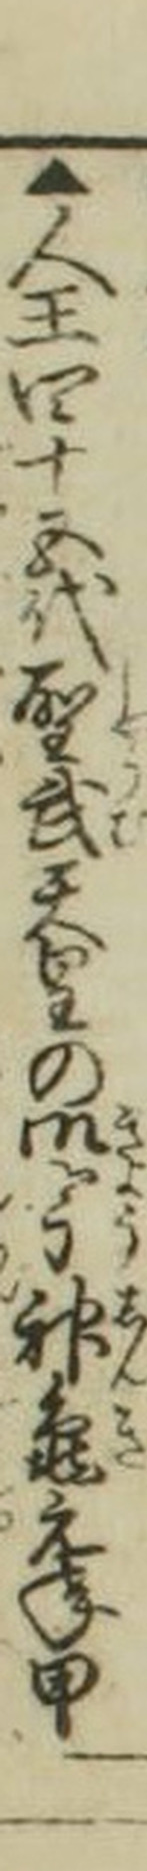▲人王四十五代聖武天皇の御宇神亀元年甲
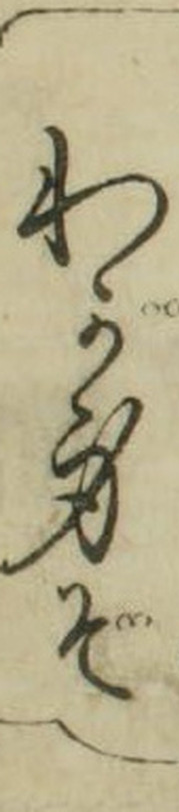わが身ぞ
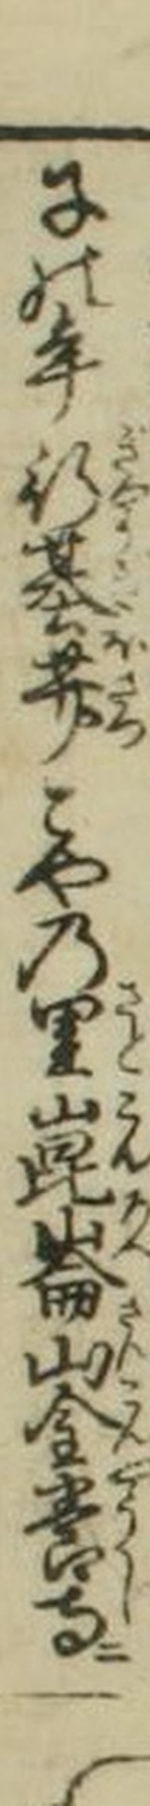子の年行基菩薩こやの里崑崙山金養寺に

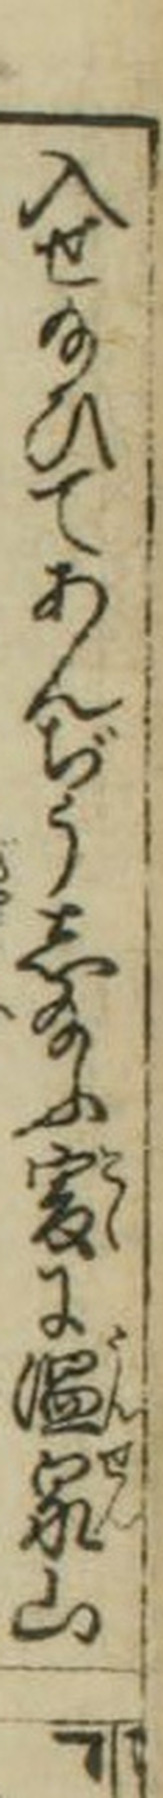入せ給ひてあんぢうし給ふ爰に温泉山
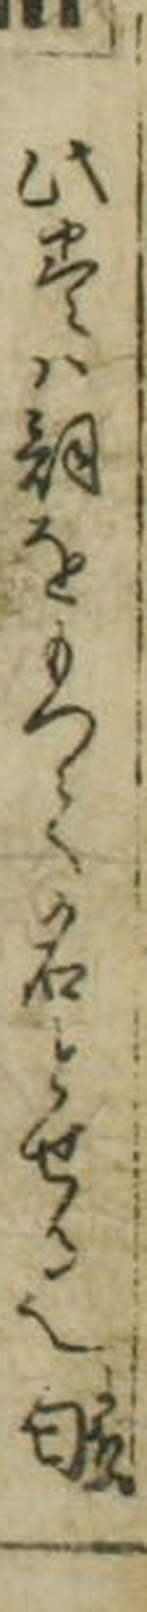此巻は詞をもつて名とせる也匂
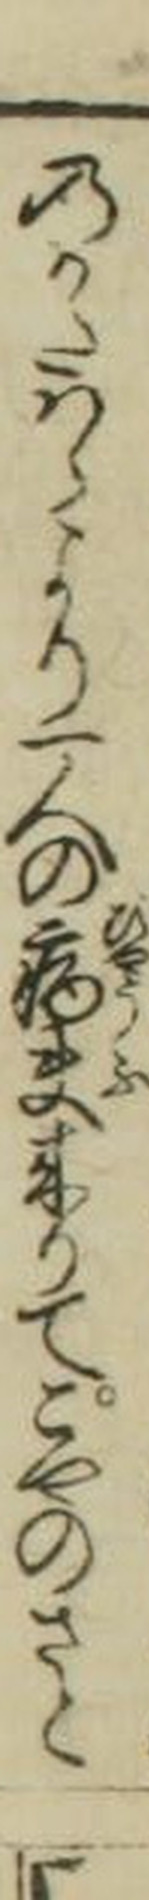のかたはらより一人の病夫来りて。こやのさと
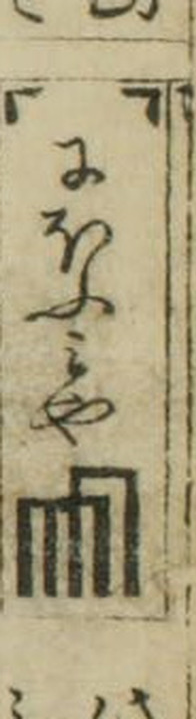にほふみや
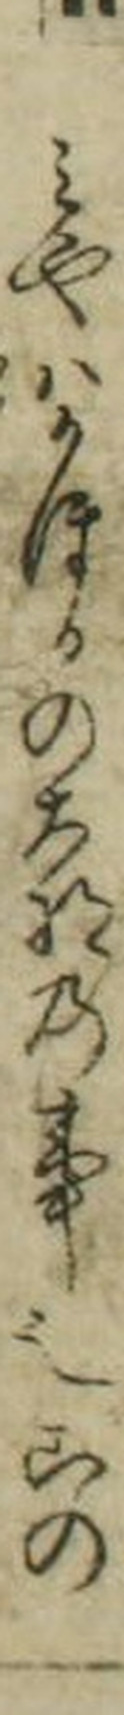みやはかほるの大将の事也。この
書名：女源氏教訓鑑
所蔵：東京学芸大学附属図書館
